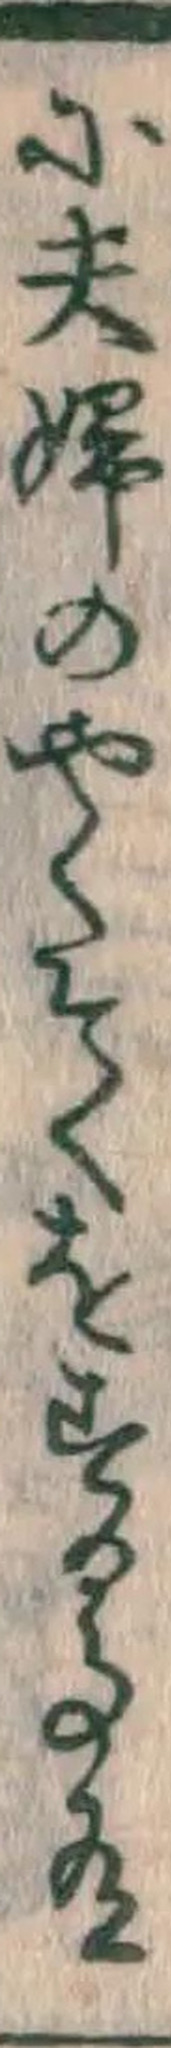に夫婦のやくそくをする事有
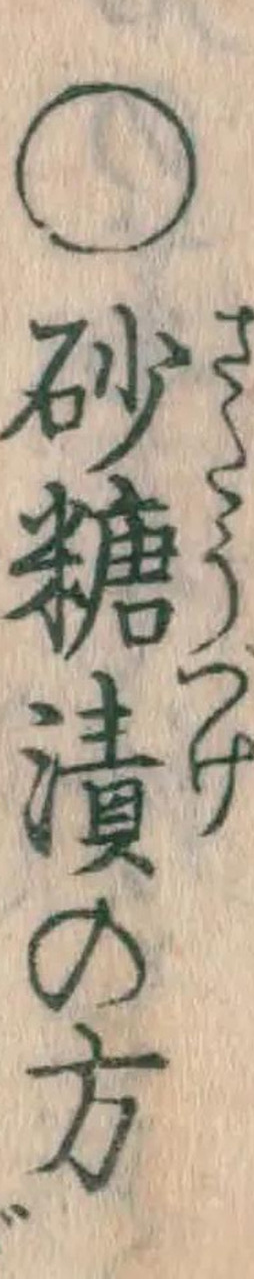○砂糖漬の方
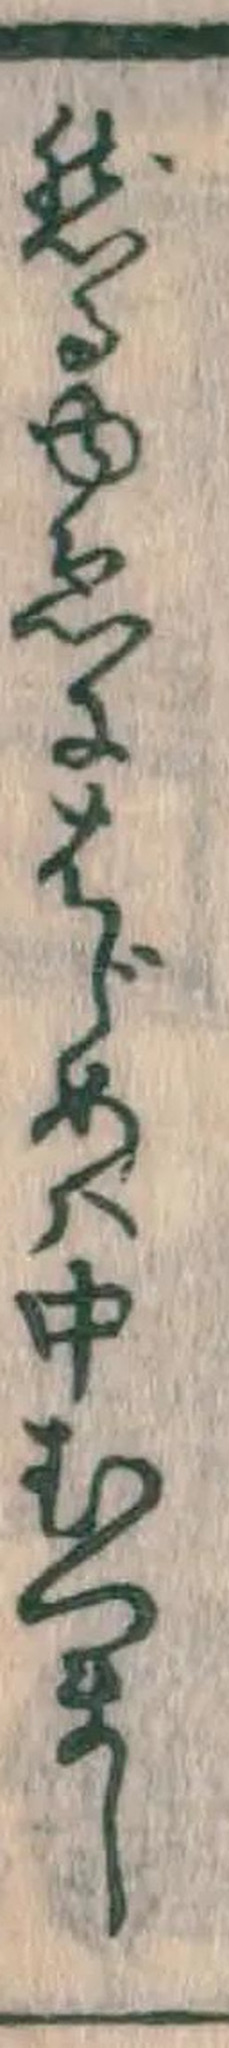然るゆゑにはじめは中むつまし
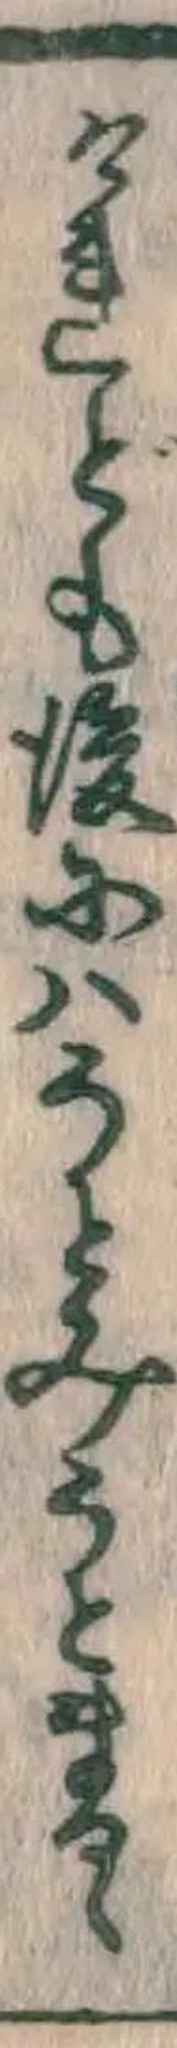けれども後にはうとみうとまるゝ
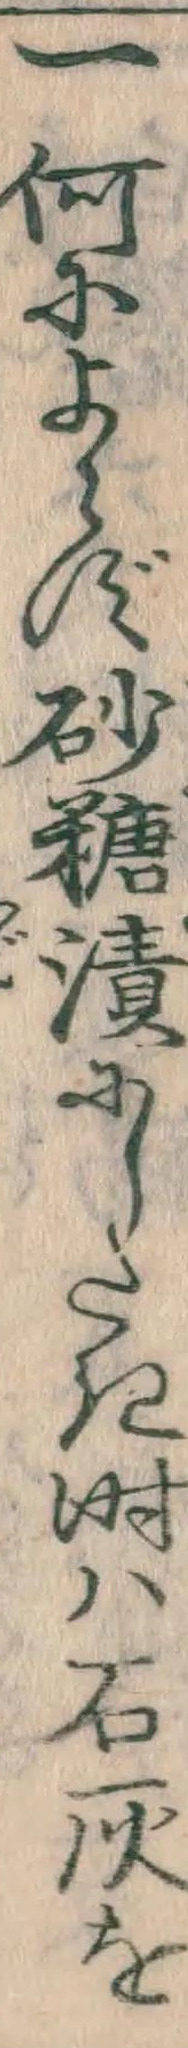一何によらず砂糖漬にしたき時は石灰を
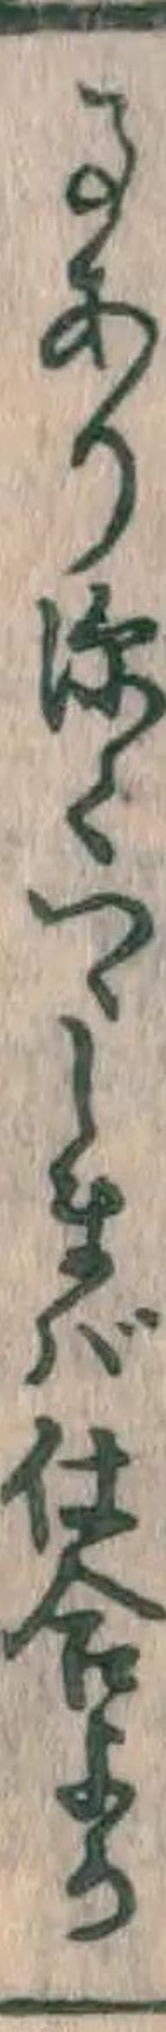事あり深くつゝしまば仕合よか
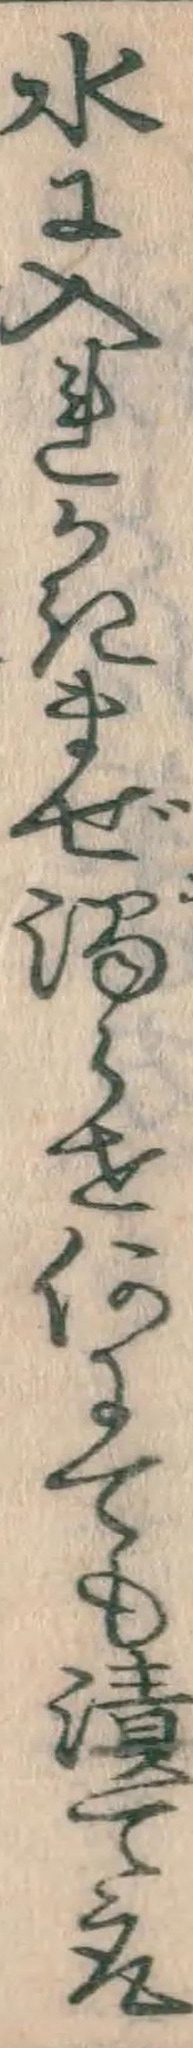水に入れかきまぜ濁らせ何にても漬て取
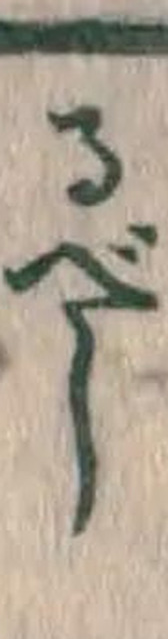るべし
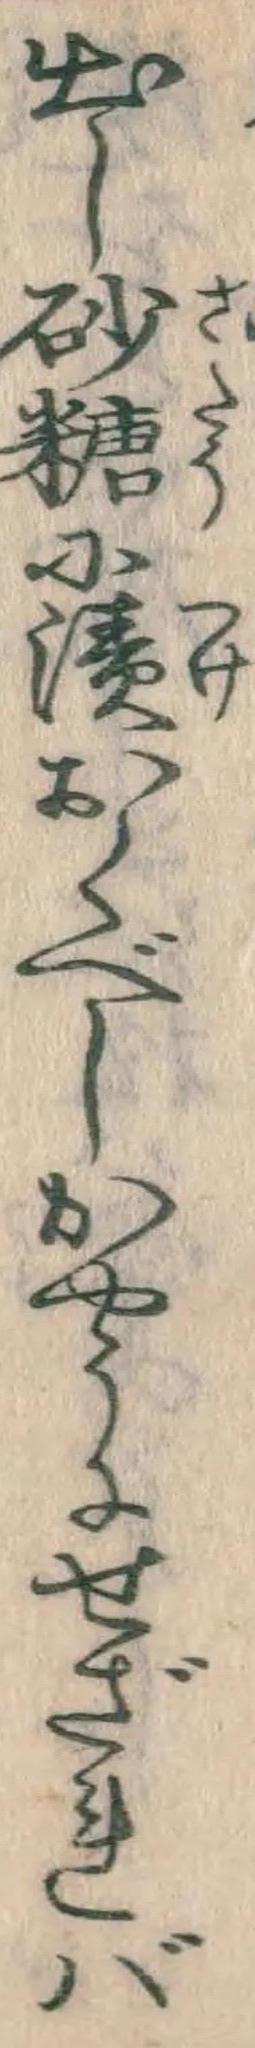出し砂糖に漬おくべしかやうにせざれば
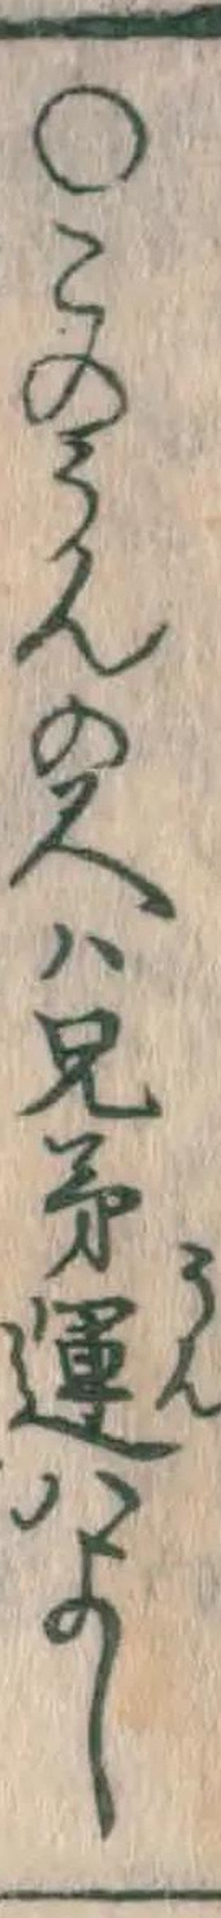○このうんの人は兄弟運はよし
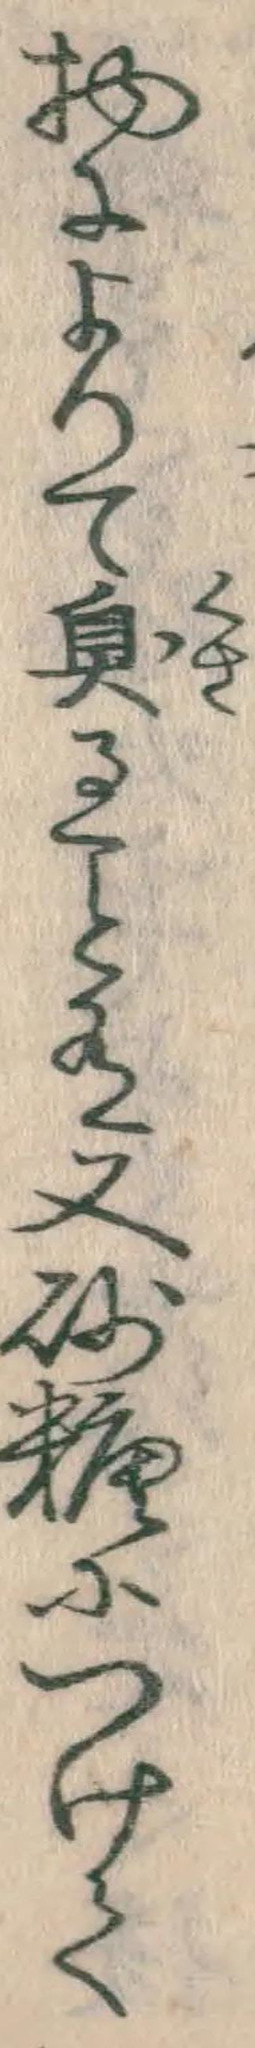物によりて臭ること有又砂糖につけて
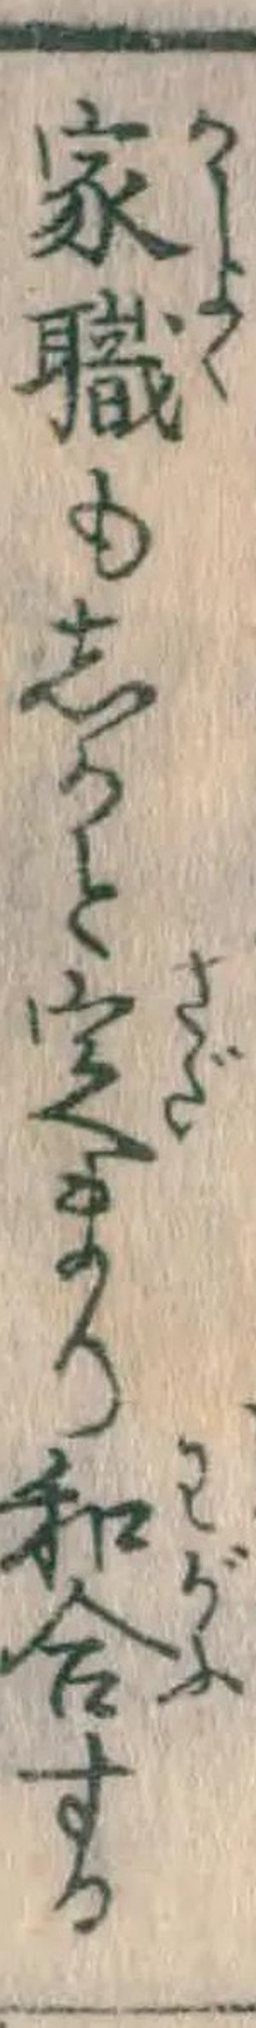家職もしかと定まり和合する
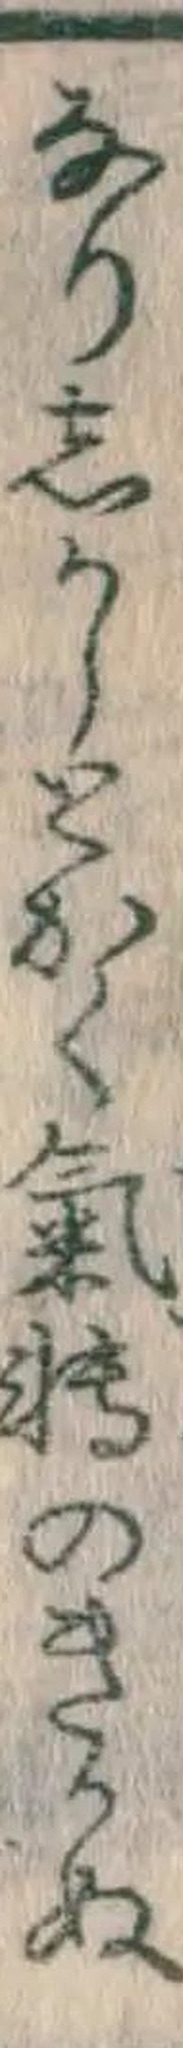なりしかしとかく気転のきかぬ
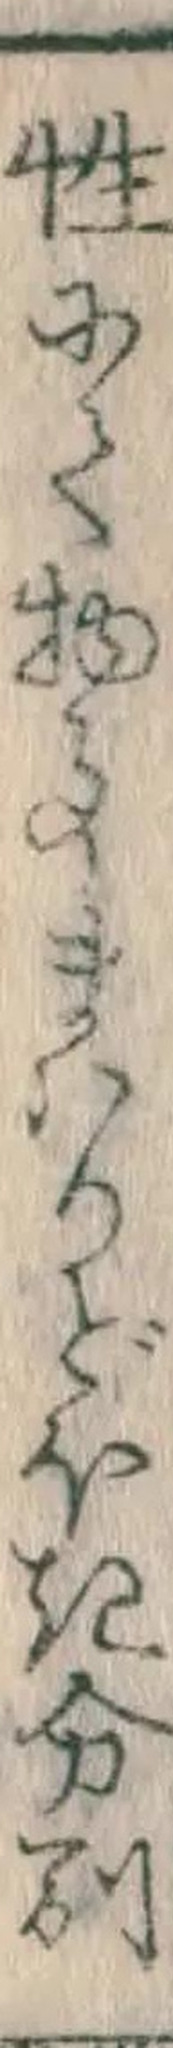性にて物事まはりどほき分別
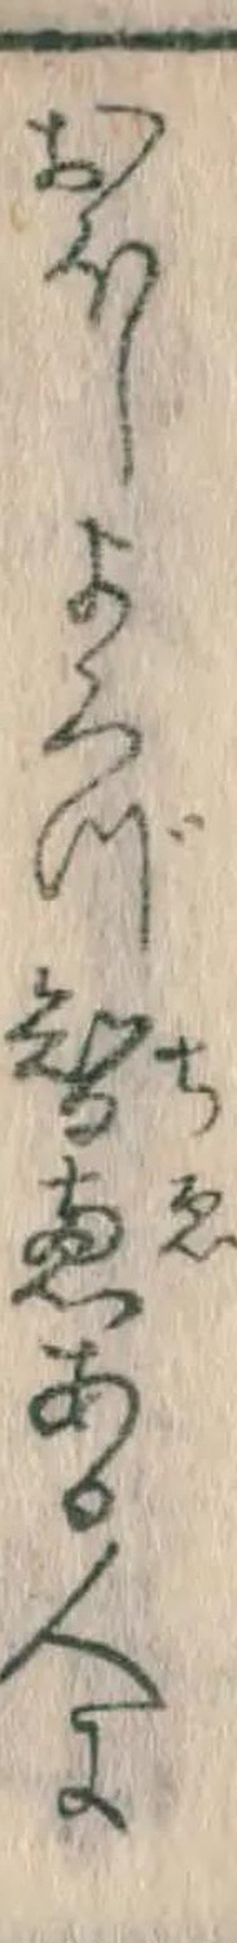おほしよろづ智恵ある人に
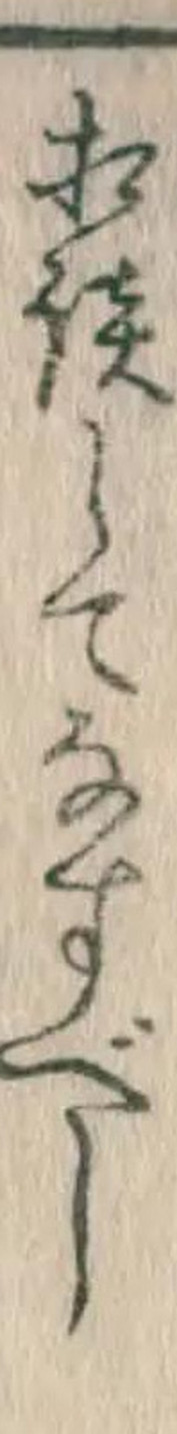相談してなすべし
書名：広益秘事大全 3巻. [2]
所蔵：国立国会図書館 National Diet Library, JAPAN
